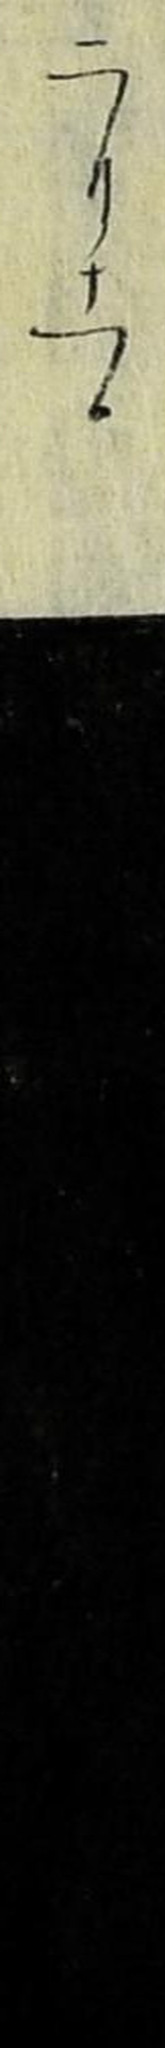二月十一日
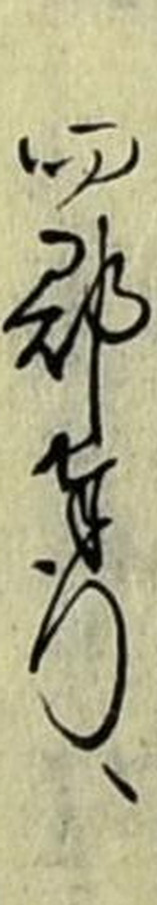後四郡奉行へ
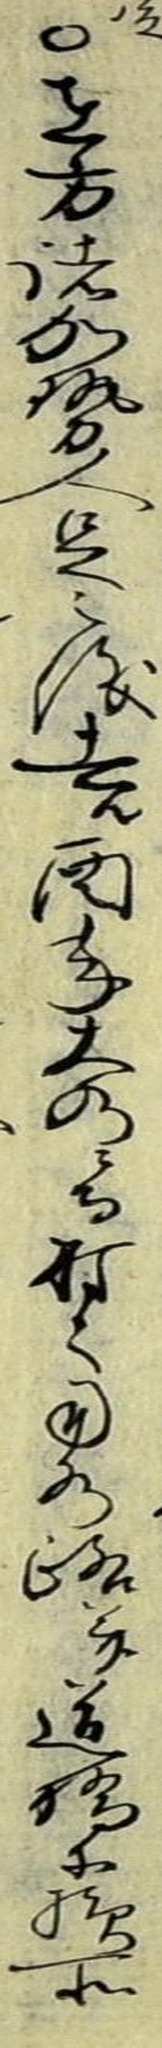〇在方諸加勢人足之儀去ル酉年大水ニ而村々用水路併道橋等損所
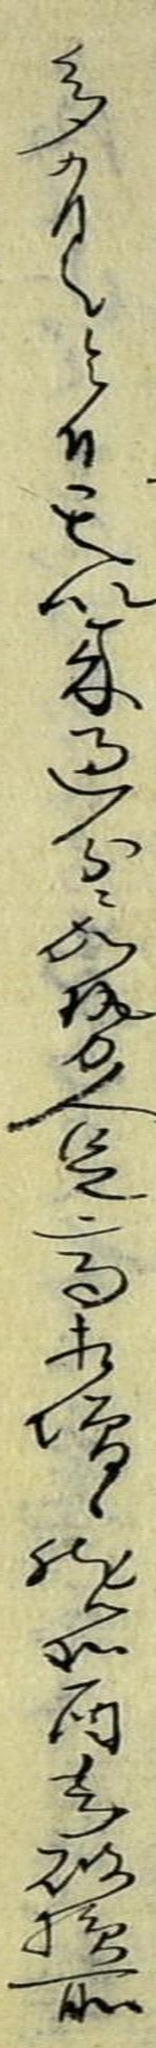多有之候ニ付其以来過分ニ加勢人足高相増候然ル処酉年聊損所

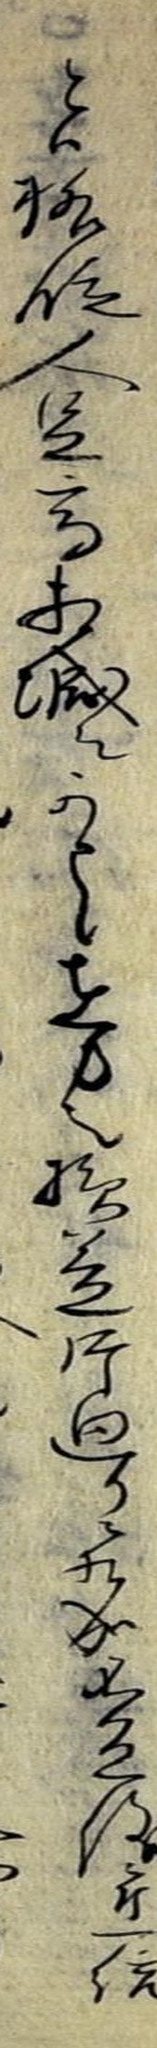とハ格段人足高相減シ可申候在方之損益片廻りニ相成不宜儀ニ付一統
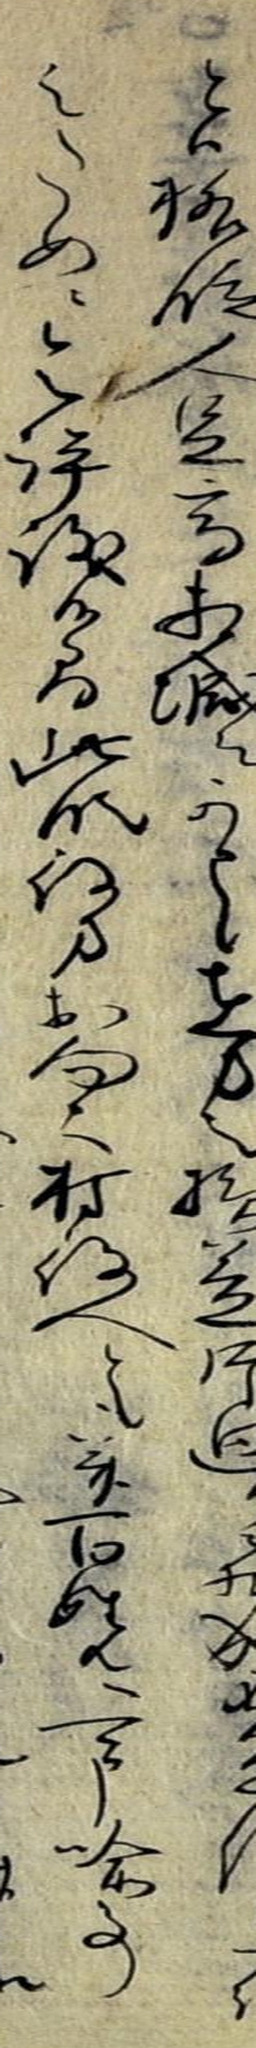之ためニ令評議候間此段役方於向々村役人とも并百姓共へ可申喩事
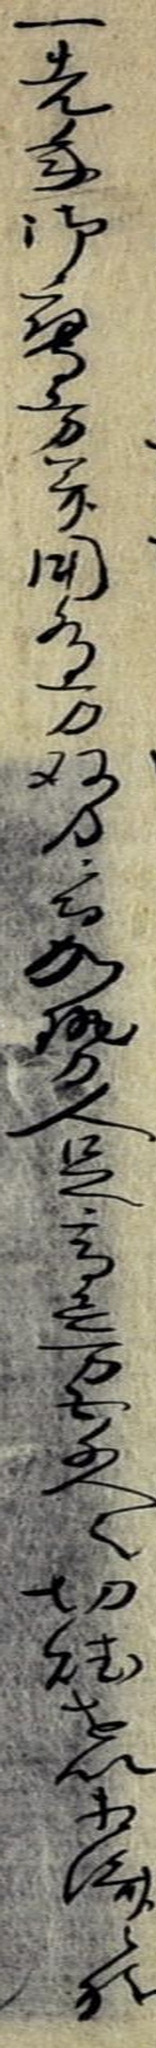一先年御鷹方并用水方双方ニ而加勢人足高壱万五千人之切賦を以相済候様
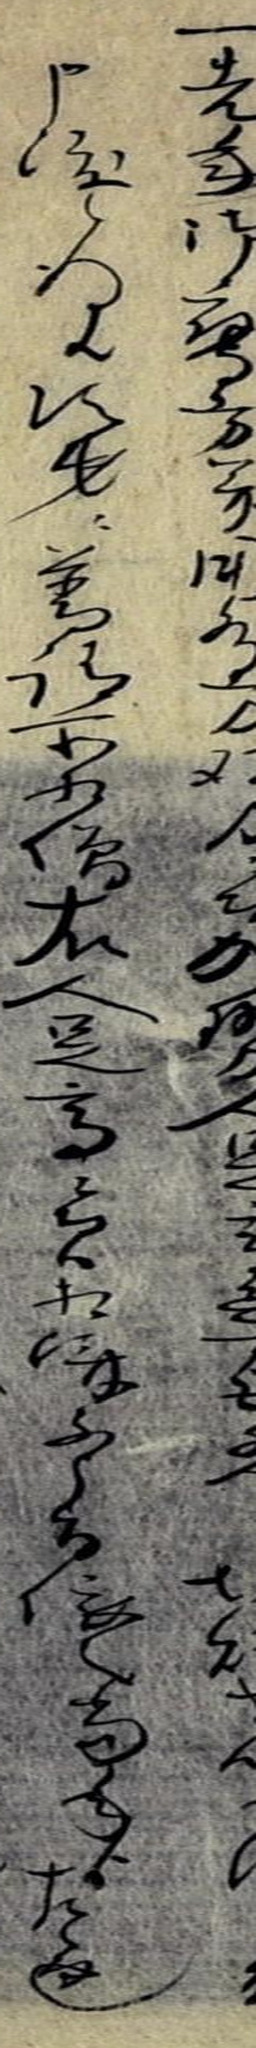申渡候得共次第ニ普請所相増右人足高ニ而ハ相済不申旨依之当年ゟ左之通
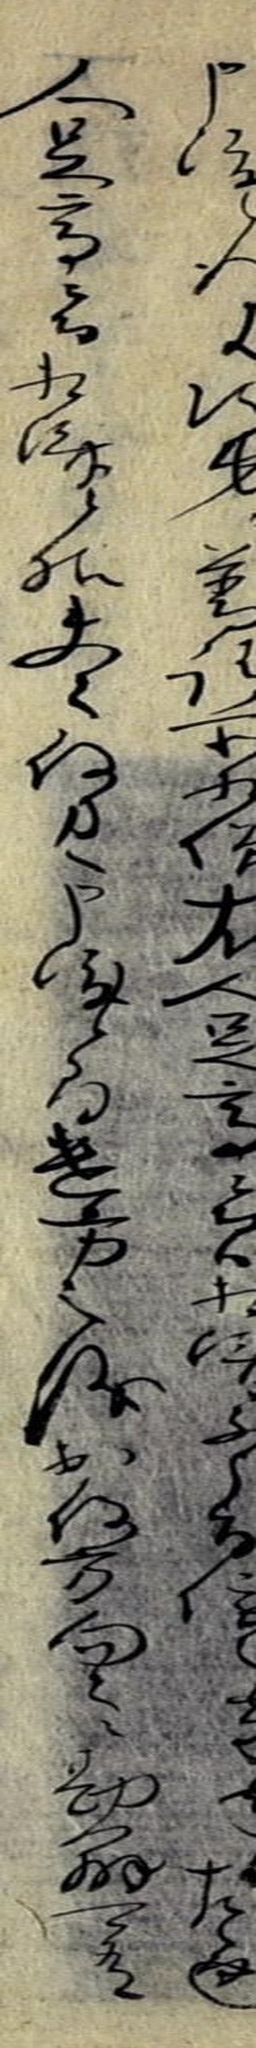人足高ニ而相済候様夫々役方へ申渡候間遣方之儀於役方向々ニ勘弁可有
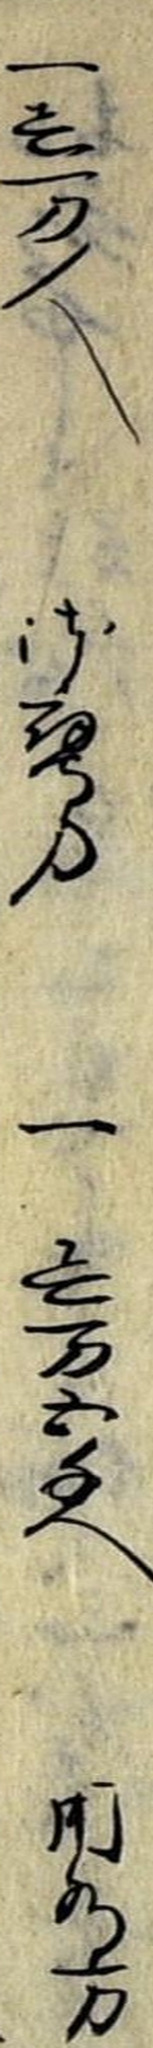一壱万人御鷹方一壱万五千人用水方
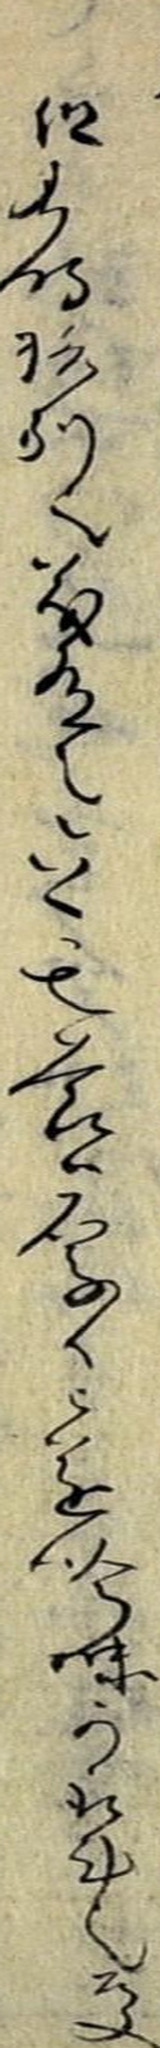但不時格別之義有之候ハヽ其節ハ厚く被遂吟味可取計之事
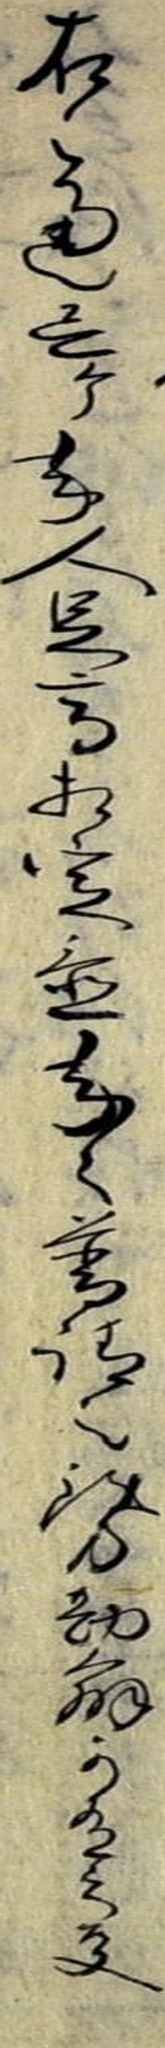右之通壱ケ年人足高相定置年々普請之致方勘弁可有之事
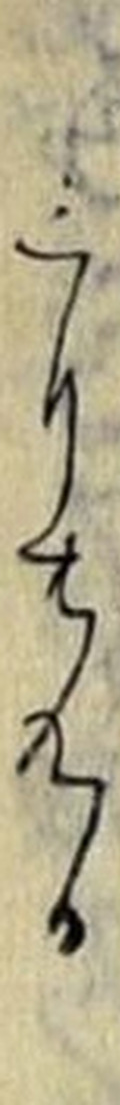三月廿九日
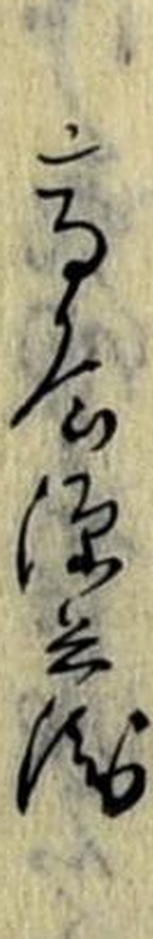高屋源兵衛
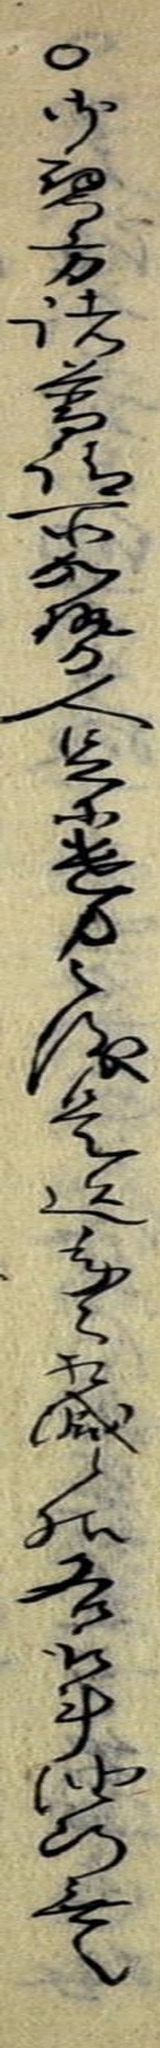〇御鷹方諸普請所加勢人足等遣方之儀是迄年々相減候様各取計油断無之
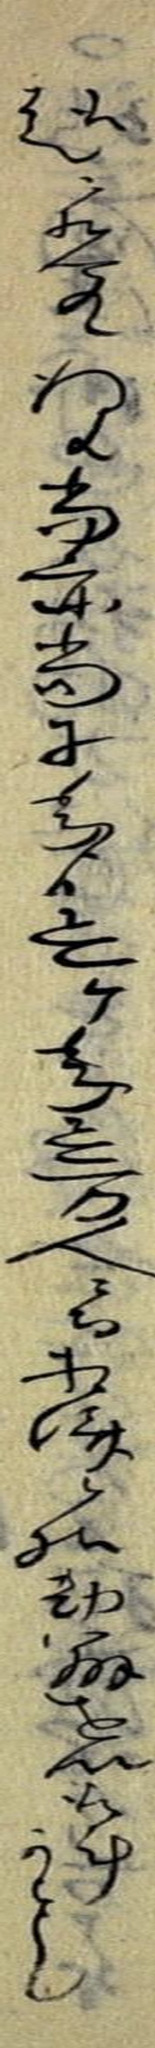趣ニ相聞候得共尚亦当寅年ゟ壱ケ年壱万人ニ而相済候様勘弁を以取計可被申候
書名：命令之部 三
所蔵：福井県文書館 Fukui Prefectural Archives
